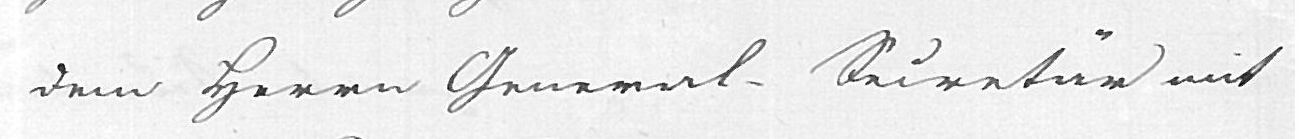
dem Herrn General-Secretär mit
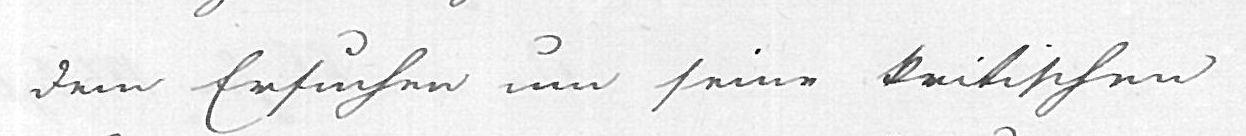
dem Ersuchen um seine kritischen
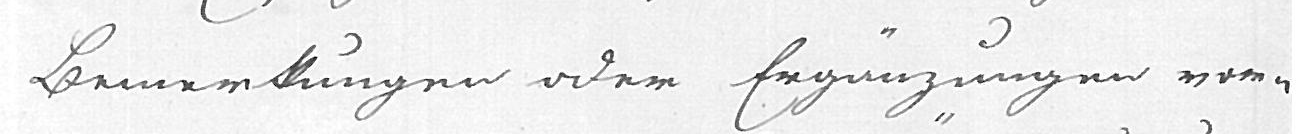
Bemerkungen oder Ergänzungen vor-
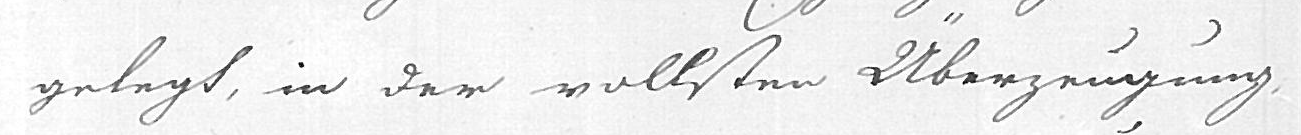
gelegt, in der vollsten Überzeugung,
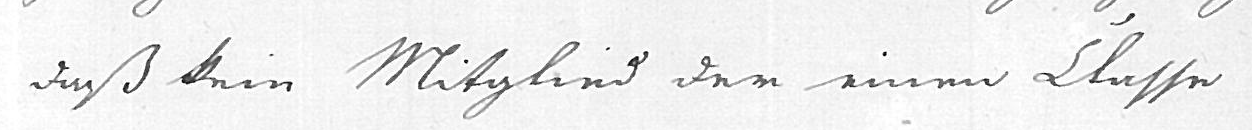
daß kein Mitglied der einen Classe
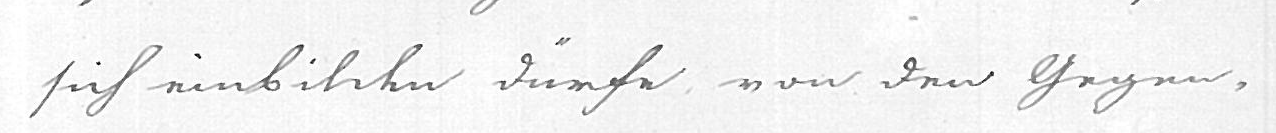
sich einbilden dürfe, von den Gegen-
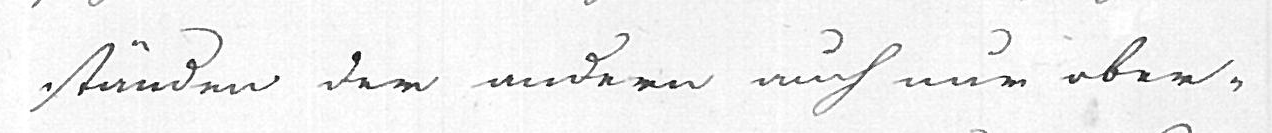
ständen der andern auch nur ober-
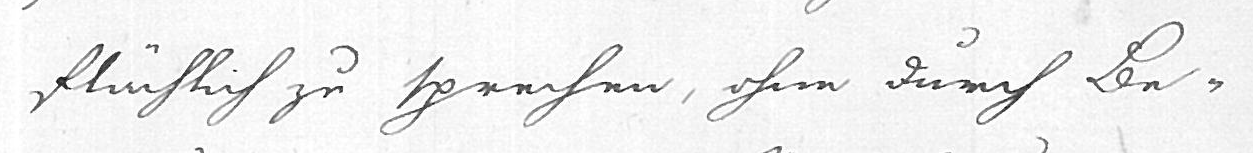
flächlich zu sprechen, ohne durch be-
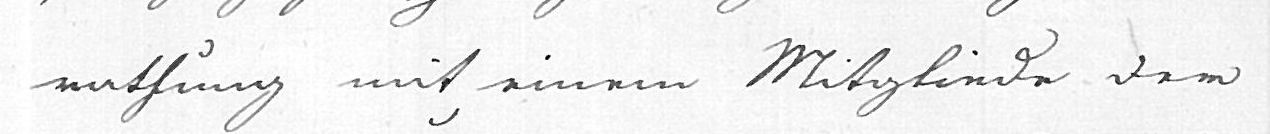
rathung mit einem Mitgliede der
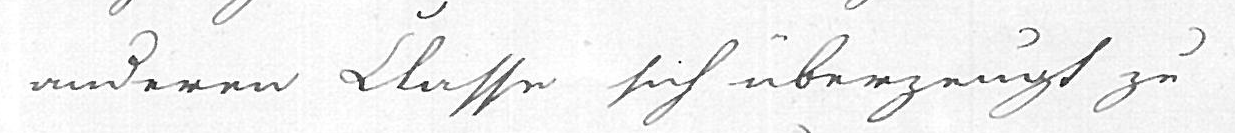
enderen Classe sich überzeugt zu
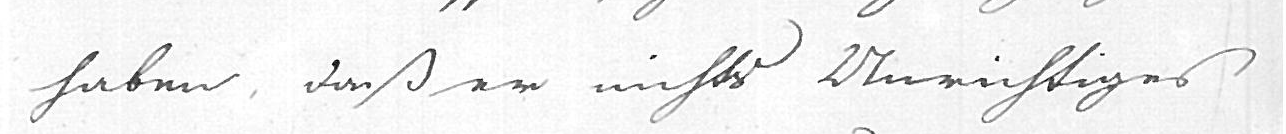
haben, daß er nichts Unrichtiges
